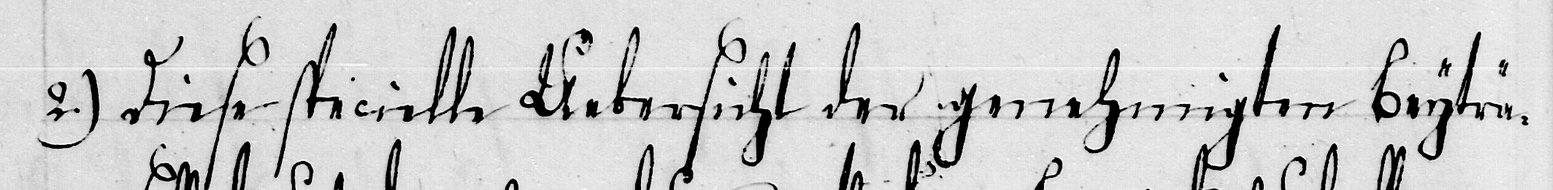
2.) Diese specielle Uebersicht der genehmigten Beyträ¬
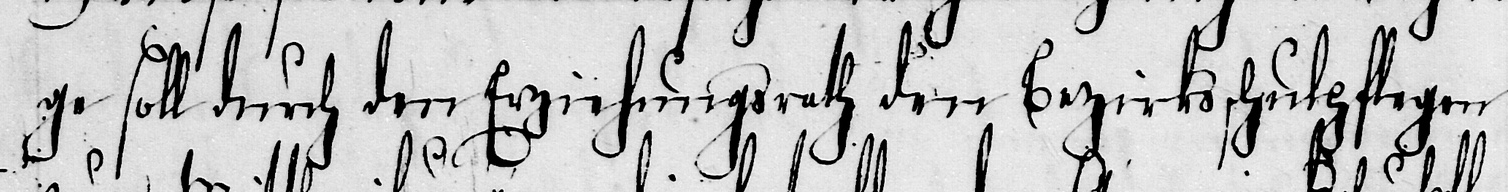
ge soll durch den Erziehungsrath den Bezirksschulpflegen
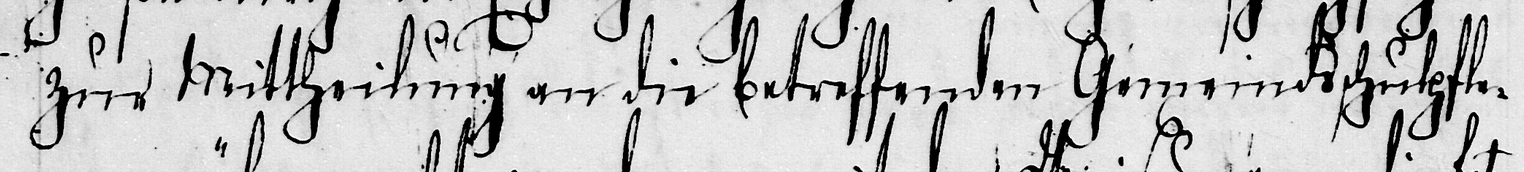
zur Mittheilung an die betreffenden Gemeindsschulpfl¬
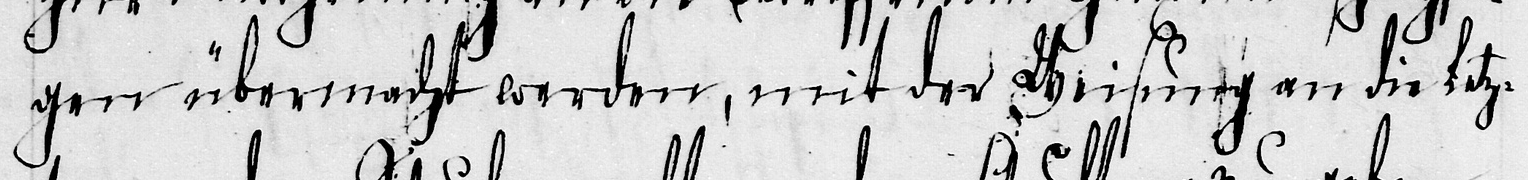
egen übermacht werden, mit der Weisung an die Letz¬
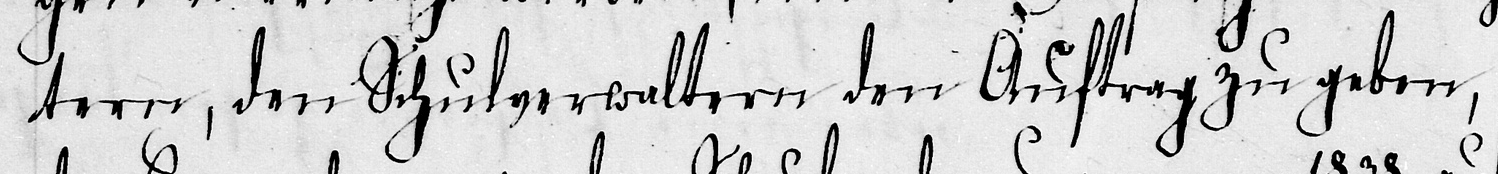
tern, den Schulverwaltern den Auftrag zu geben,
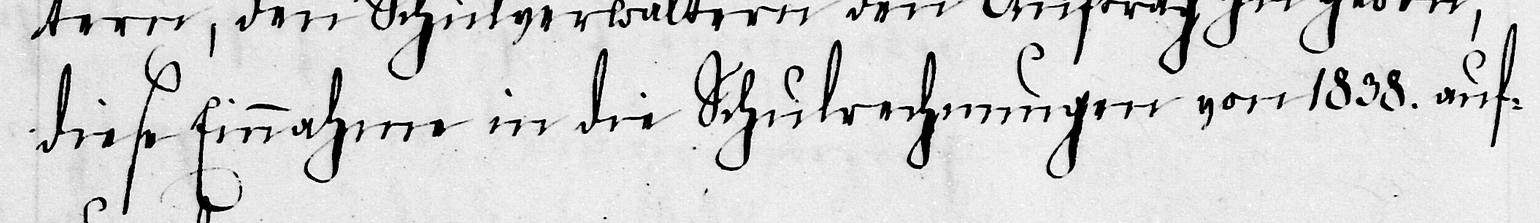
diese Einnahme in die Schulrechnungen von 1838. auf¬
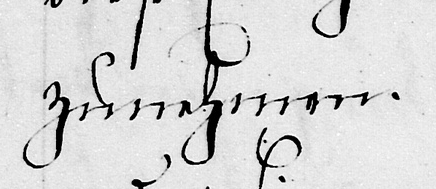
zunehmen.
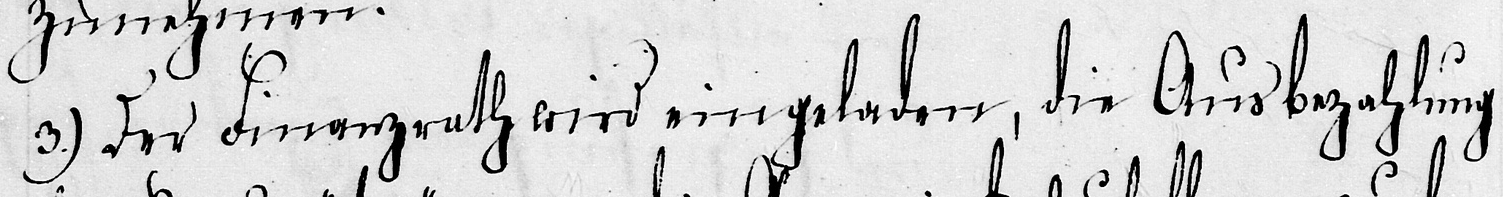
3.) Der Finanzrath wird eingeladen, die Ausbezahlung
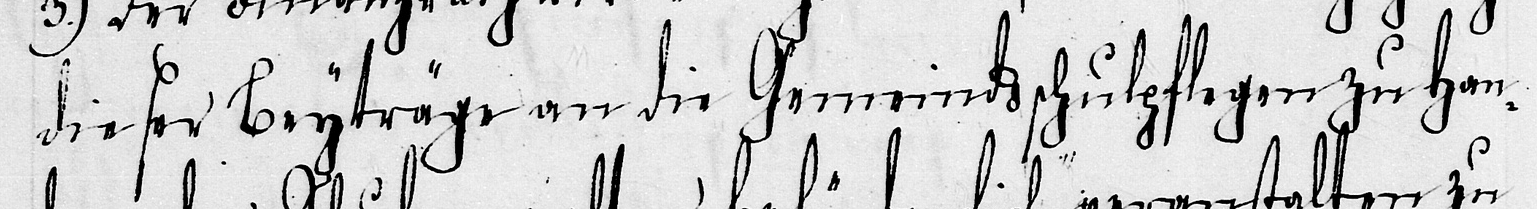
dieser Beyträge an die Gemeindsschulpflegen zu Han¬
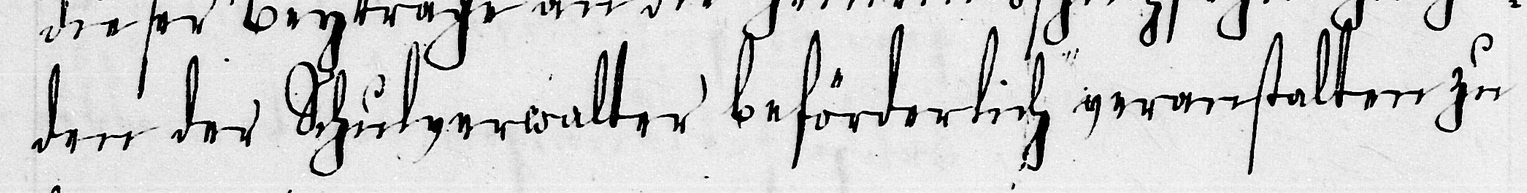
den der Schulverwalter beförderlich veranstalten zu
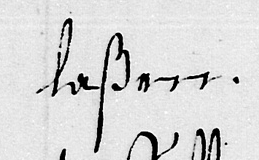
laßen.
